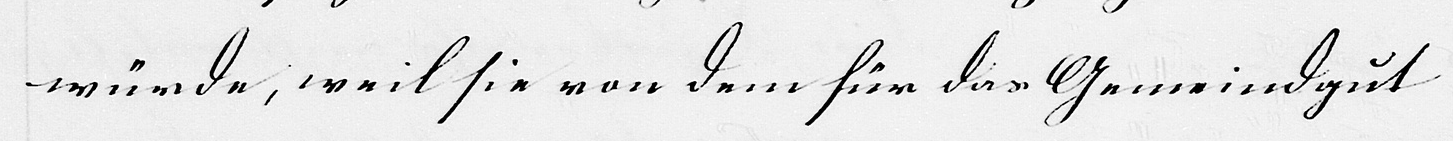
würde, weil sie von dem für das Gemeindgut
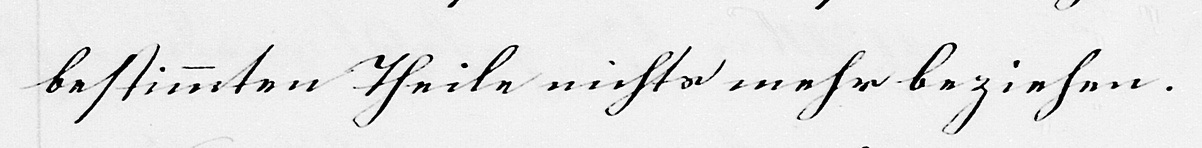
bestimmten Theile nichts mehr beziehen.
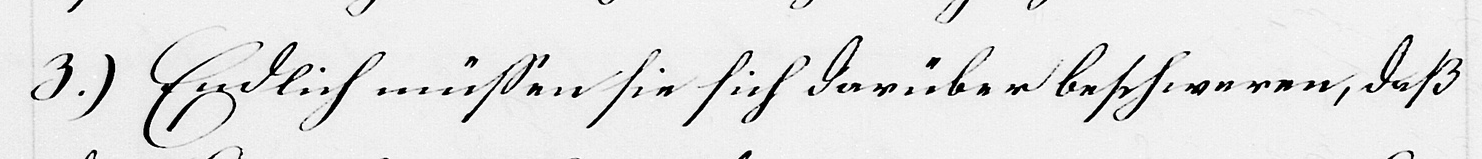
3.) Endlich müßen sie sich darüber beschweren, daß
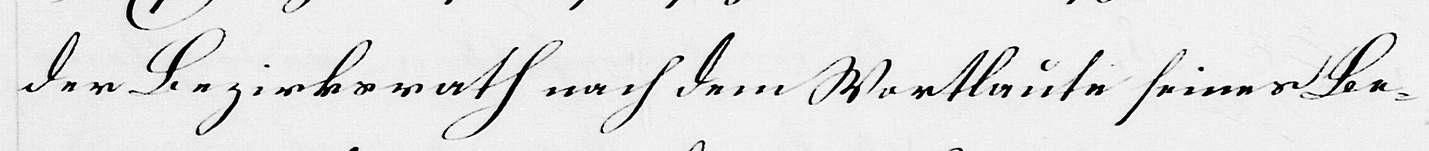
der Bezirksrath nach dem Wortlaute seines Be¬
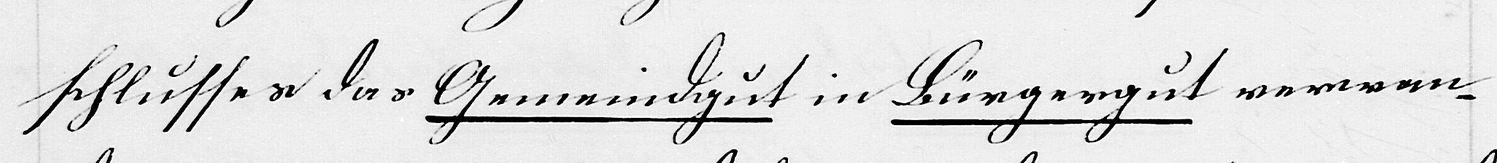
schlusses das Gemeindgut in Bürgergut verwan¬
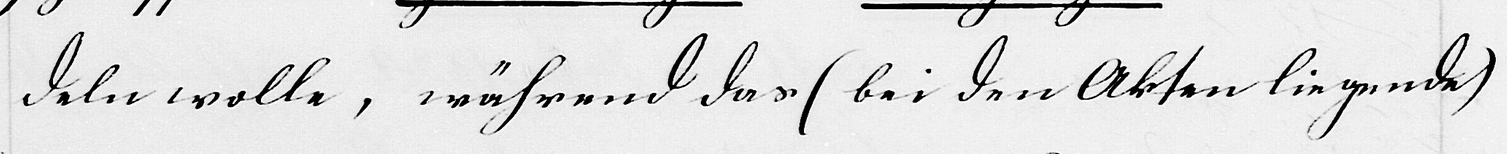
deln wolle, während das (bei den Akten liegende)
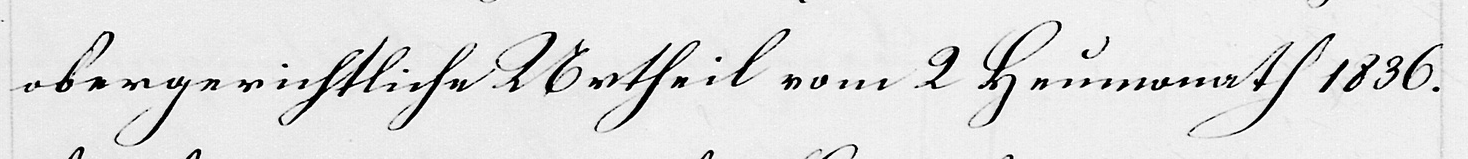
obergerichtliche Urtheil vom 2 Heumonath 1836.
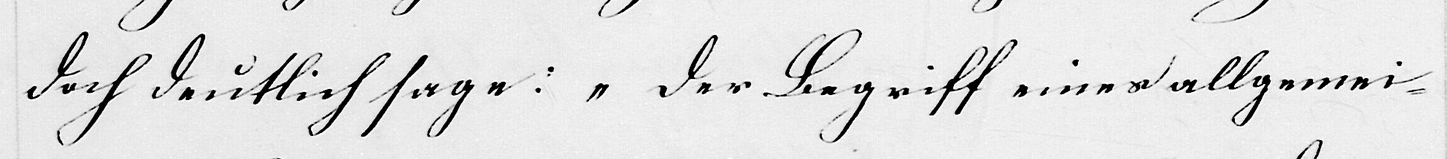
doch deutlich sage: „Der Begriff eines allgemei¬
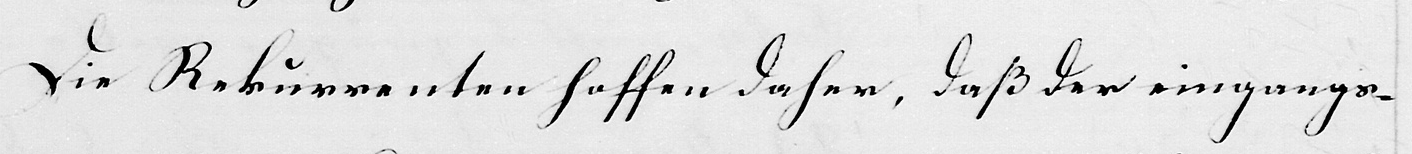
Die Rekurrenten hoffen daher, daß der eingangs¬
